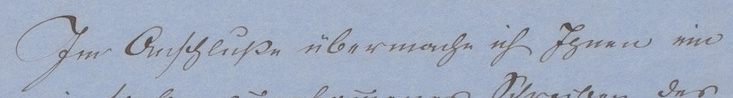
Im Anschluße übermache ich Ihnen ein
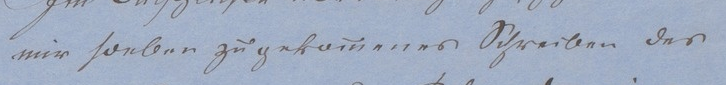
mir soeben zugekommenes Schreiben des
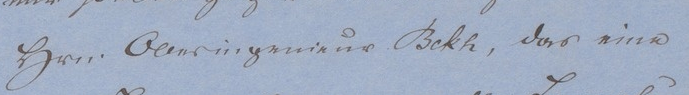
Hrn. Oberingenieur Bekh, das eine
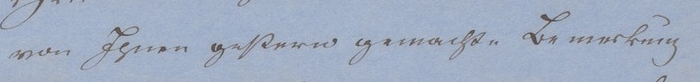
von Ihnen gestern gemachte Bemerkung
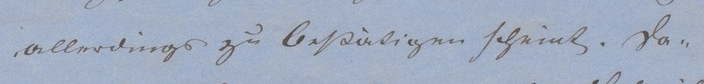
allerdings zu bestätigen scheint. Da-
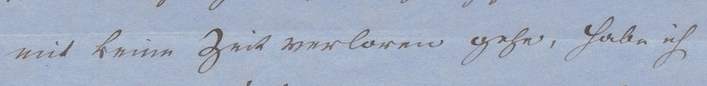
mit keine Zeit verloren gehe, habe ich
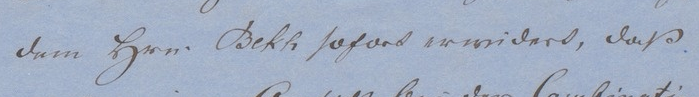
dem Hrn. Bekh sofort erwidert, daß
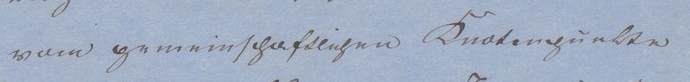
vom gemeinschaftlichen Knotenpunkte
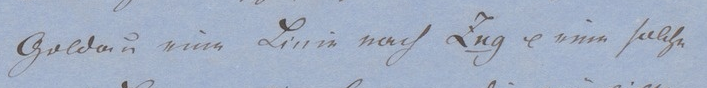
Goldau eine Linie nach Zug & eine solche
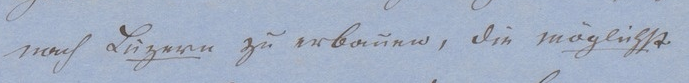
nach Luzern zu erbauen, die möglichst
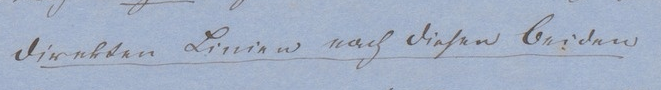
direkten Linien nach diesen beiden
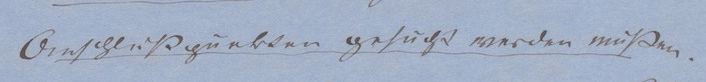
Anschlußpunkten gesucht werden müßen.
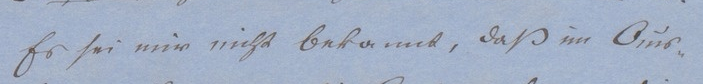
Es sei mir nicht bekannt, daß im Aus-
